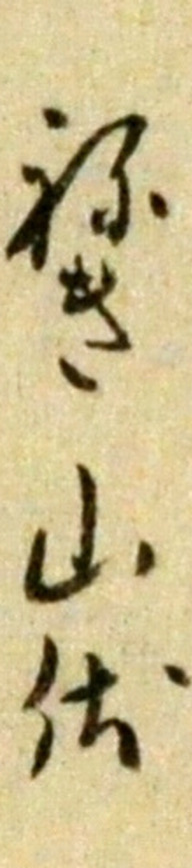ねき山伏
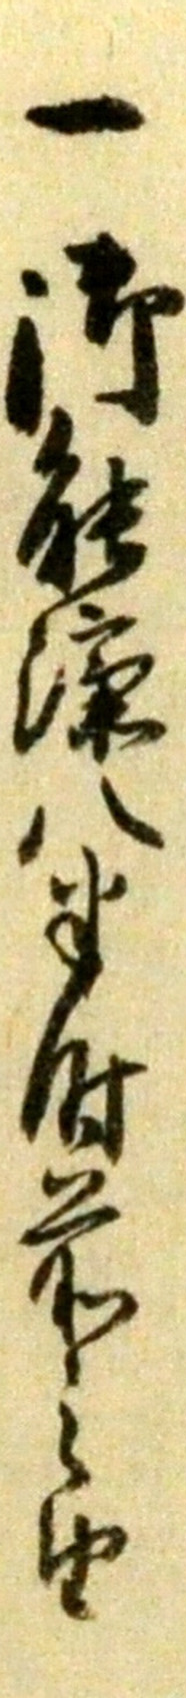一御能済八半時前之由
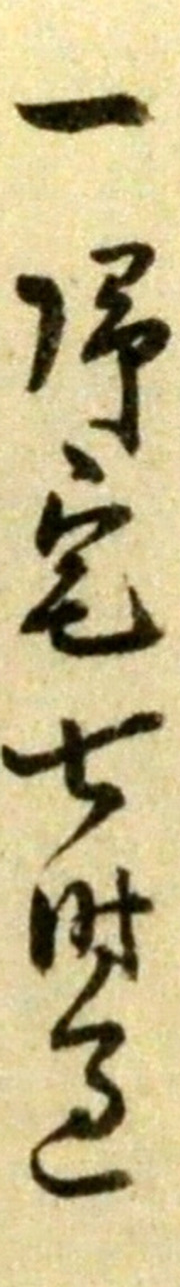一帰宅七時過
